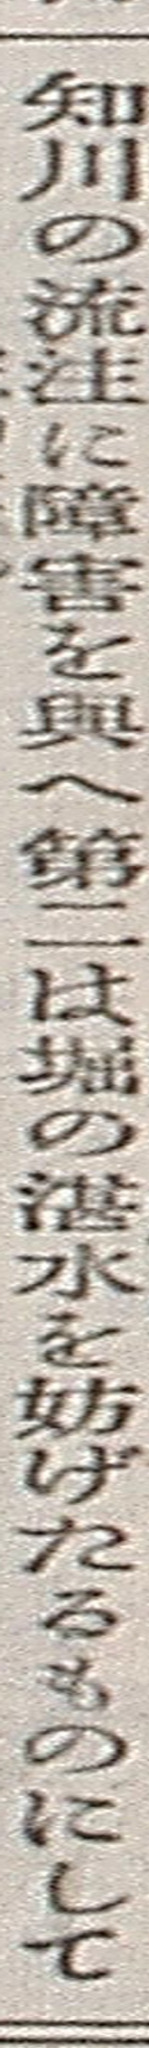知川の流注に障害を輿へ第二は堀の湛水を妨げたるものにして
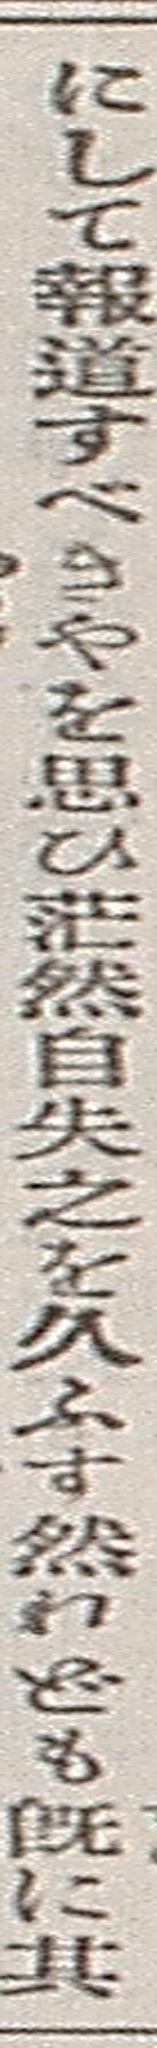にして報道すべきやを思ひ茫然自失之を久ふす然れども既に其
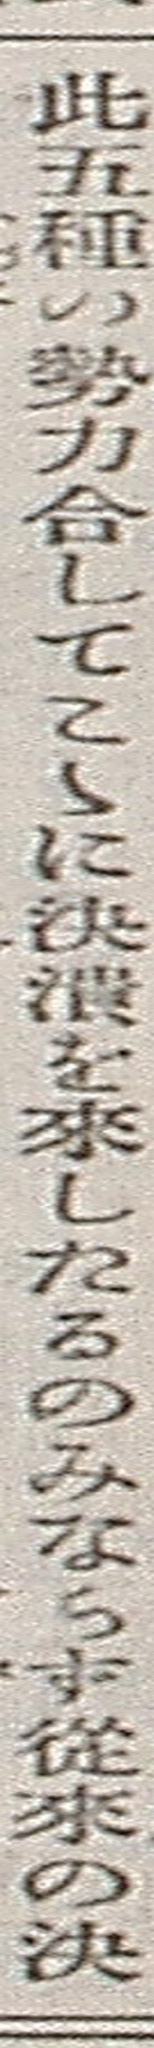此五種の勢力合してこゝに决潰を来したるのみならず従来の决
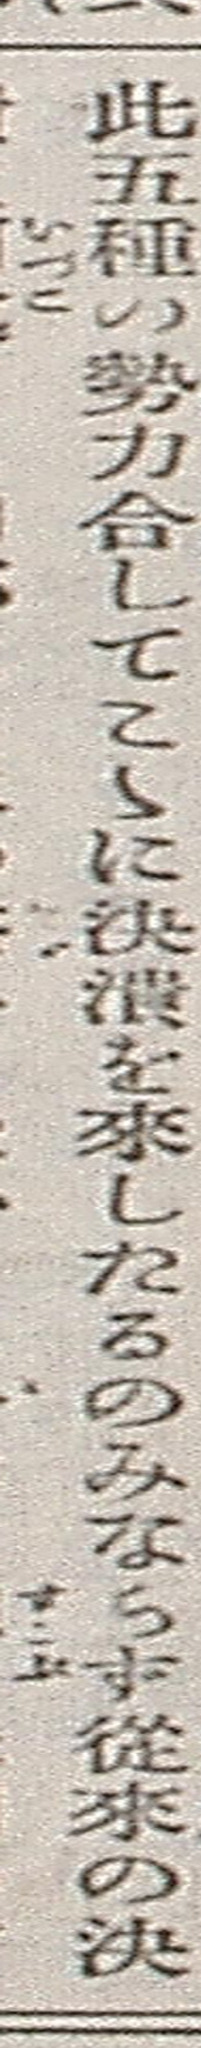此五種の勢力合してこゝに决潰を来したるのみならず従来の决
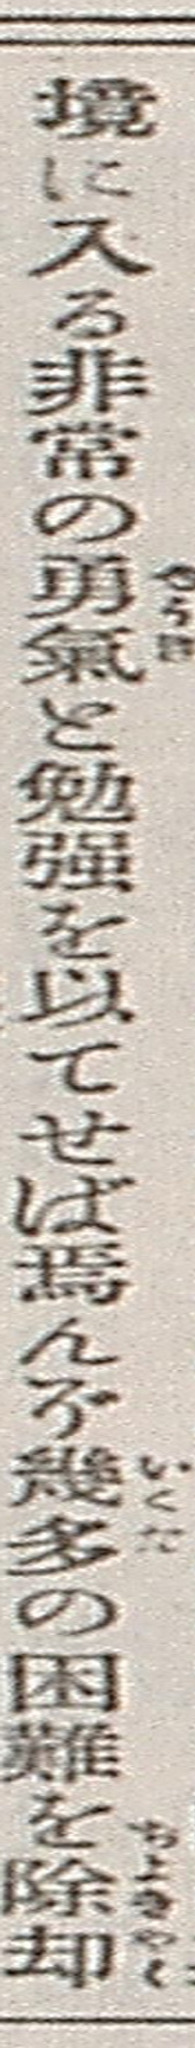境に入る非常の勇気と勉強を以てせば焉んぞ幾多の困難を除却
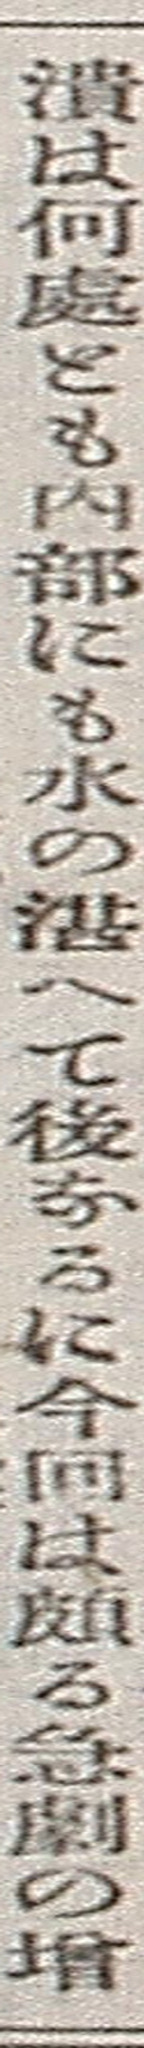潰は何処とも内部にも水の湛へて後なるに今回は頗る急劇の増
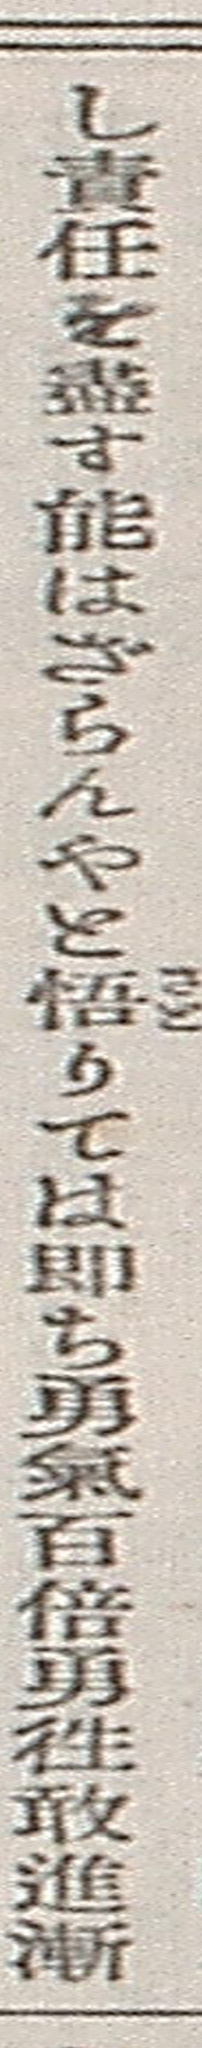し責任を盡す能はざらんやと悟りては即ち勇気百倍勇往敢進漸
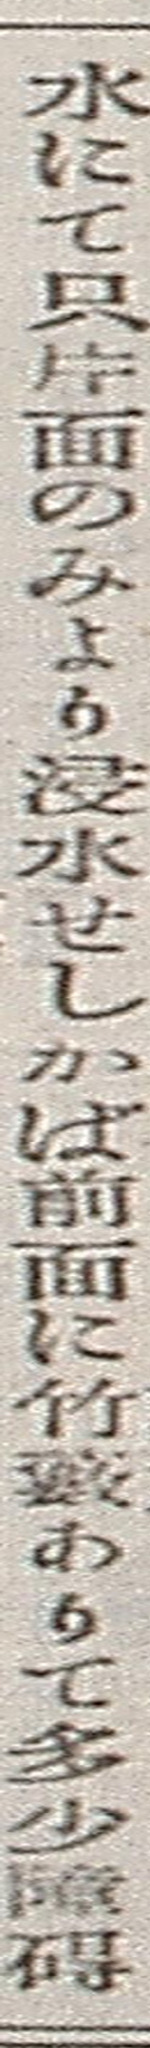水にて只片面のみより浸水せしかば前面に竹藪ありて多少障碍
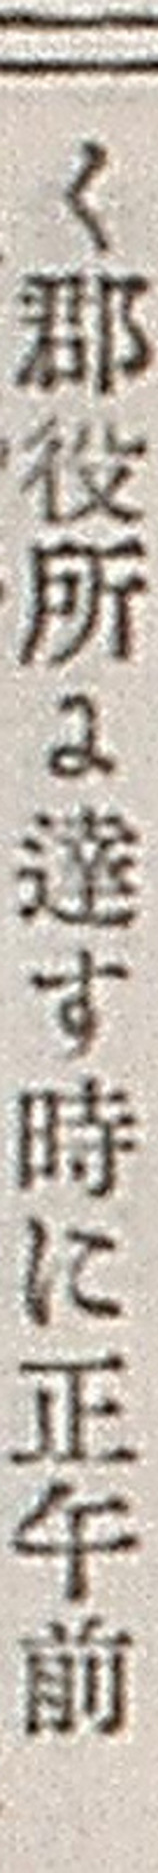く郡役所に達す時に正午前
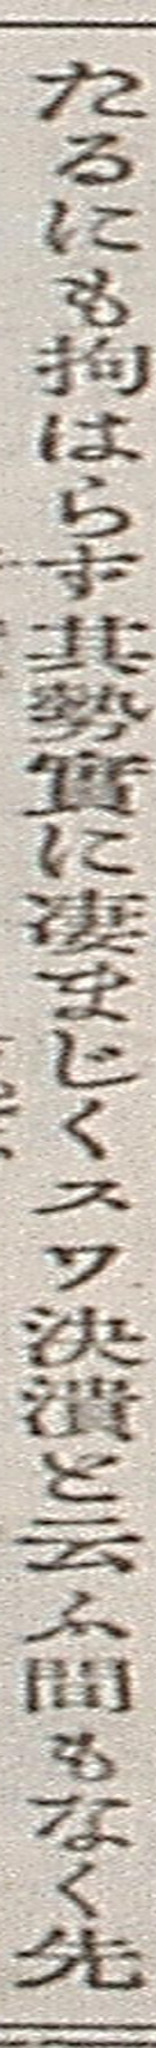たるにも拘はらず其勢実に凄まじくスワ决潰と云ふ間もなく先
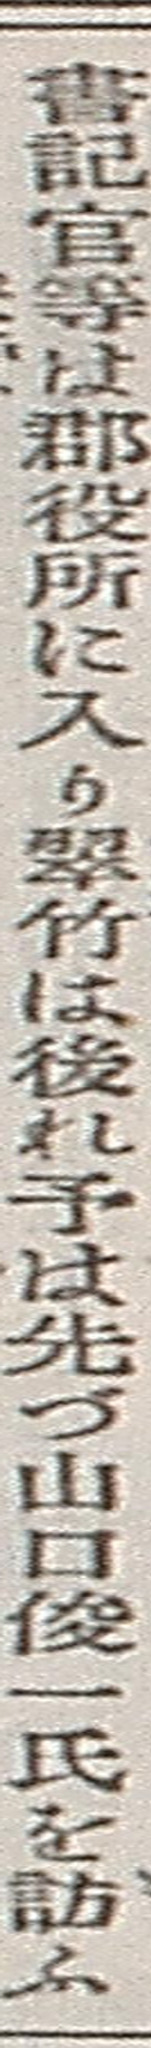書記官等は郡役所に入り翠竹は後れ予は先づ山口俊一氏を訪ふ
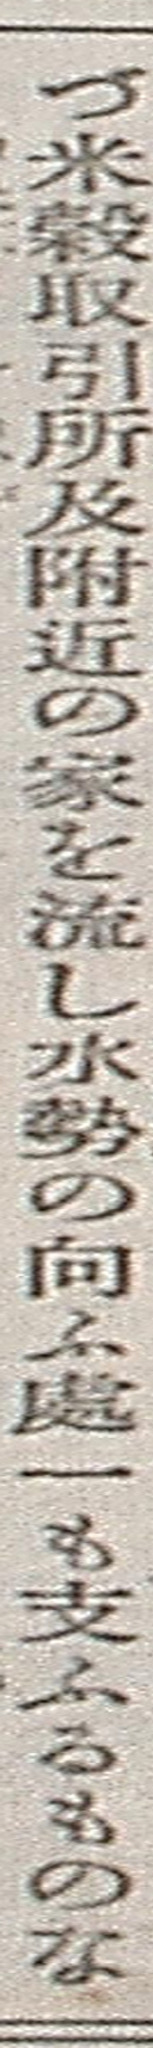づ米穀取引所及附近の家を流し水勢の向ふ処一も支ふるものな
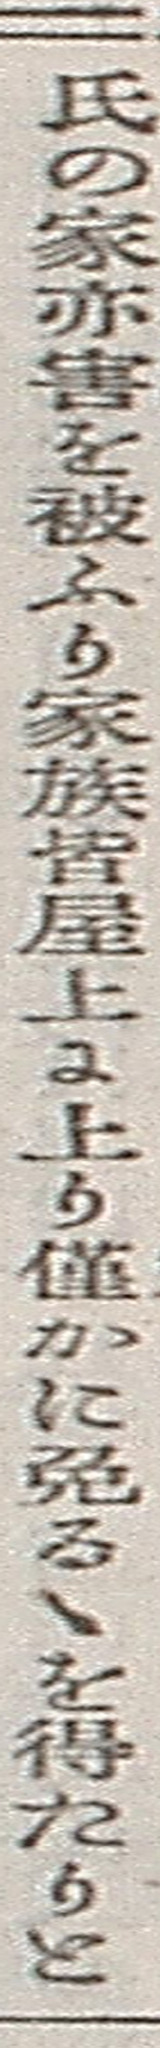氏の家亦害を被ふり家族皆屋上に上り僅かに免るゝを得たりと
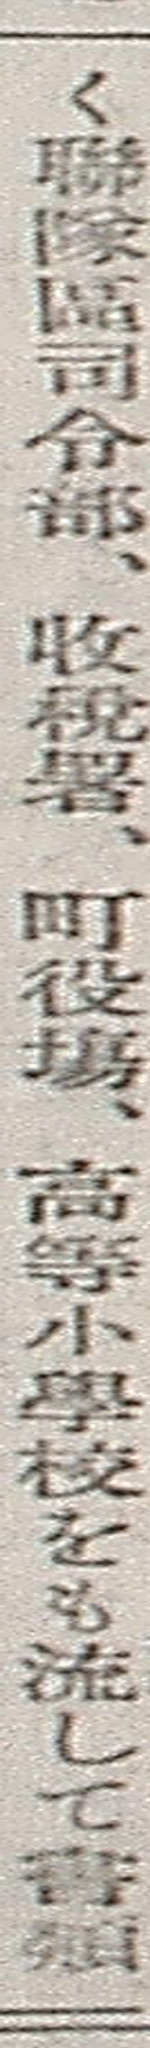く聯隊區司令部、収税署、町役場、高等小学校をも流して書類

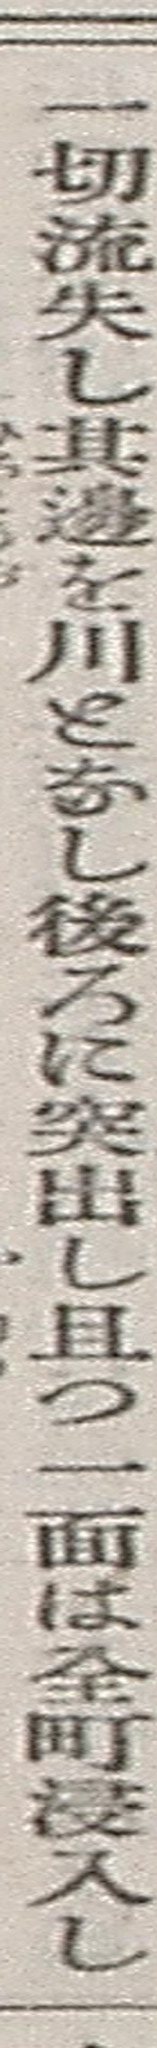一切流失し其辺を川となし後ろに突出し且つ一面は全町侵入し
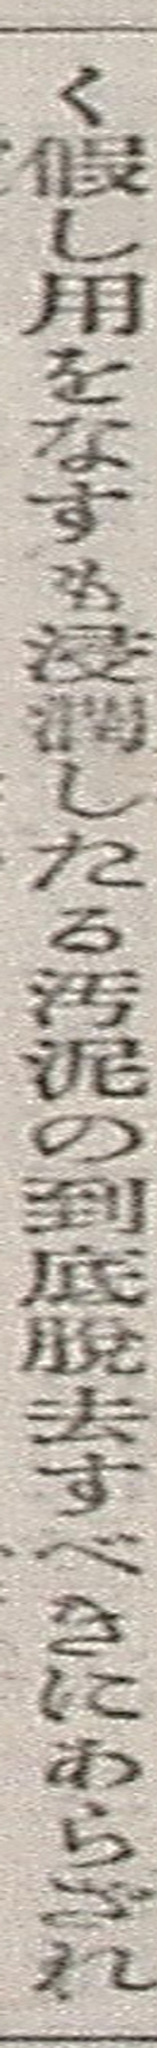く仮し用をなすも浸潤したる汚泥の到底脱去すべきにあらざれ
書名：風俗畫報臨時増刊第百二十六號　洪水被害録（中）
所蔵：東京大学地震研究所図書室 Earthquake Research Institute Library, The University of Tokyo, JAPAN
